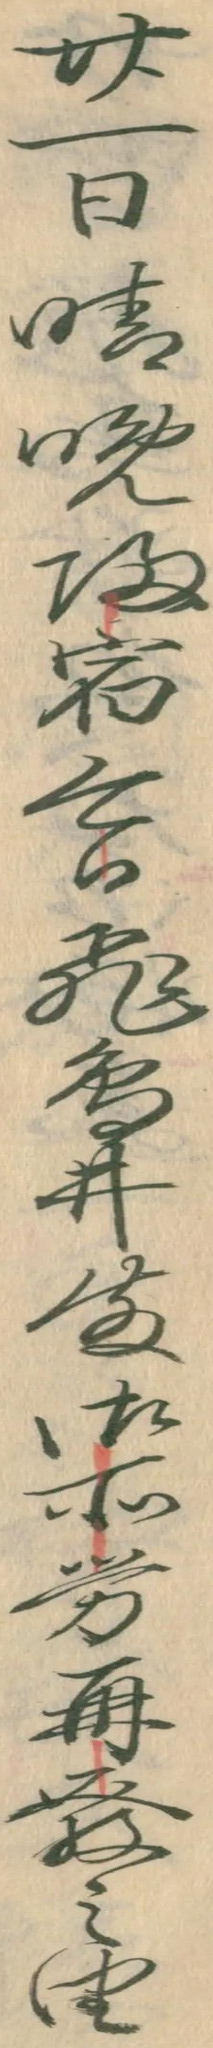廿一日晴晩帰-宿今-日飛鳥井殿御-所-労再-発之由
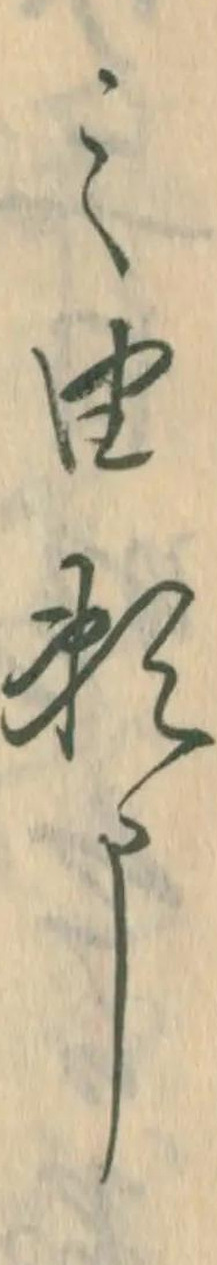之由頼申

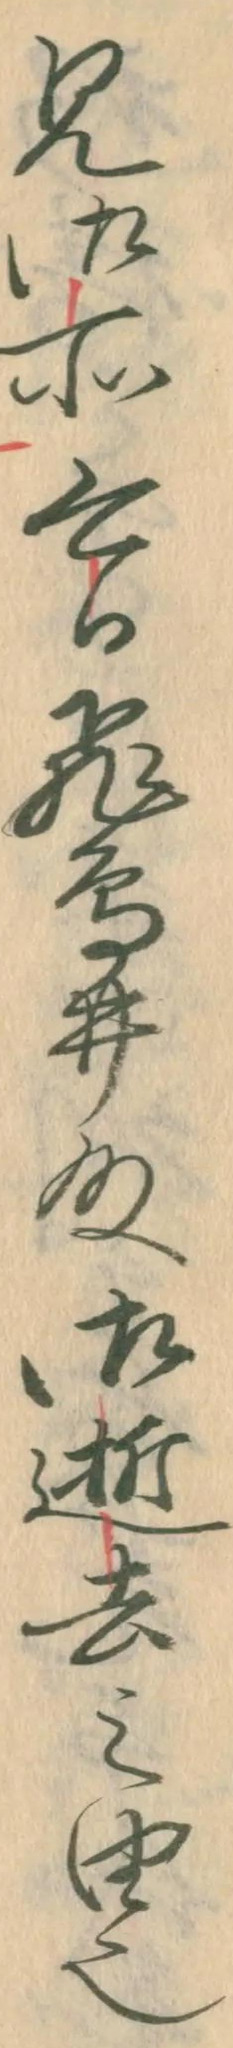見御-所今-日飛鳥井殿御-逝-去之由也
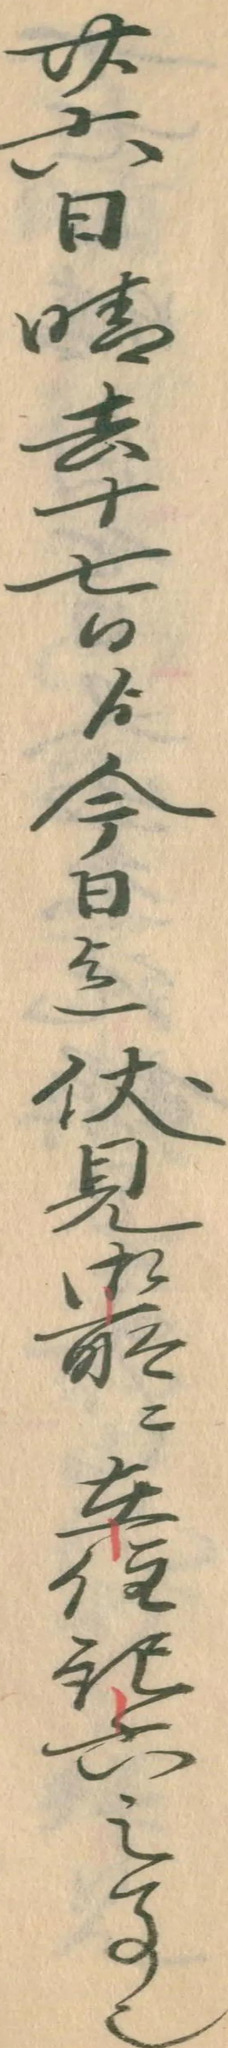廿六日晴去十七日ゟ今日迄伏見御-所ニ在-住記-六之事也
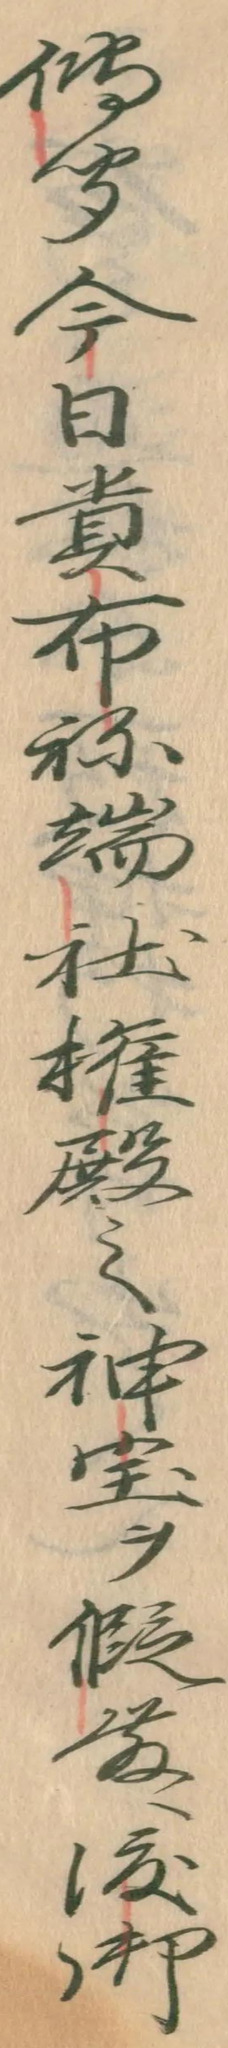伝_聞今-日貴-布-祢端_社権-殿之神-宝ヲ仮_殿へ渡-御
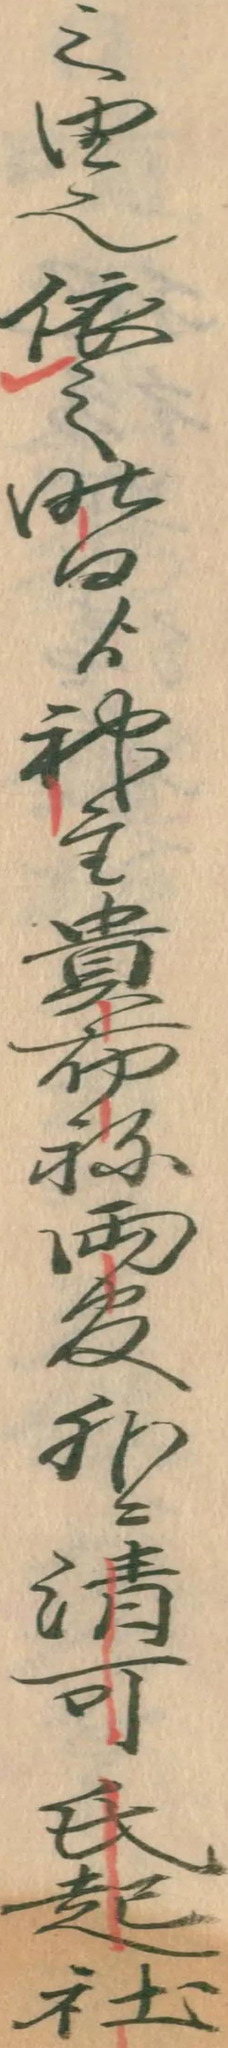之由也依之昨-日ゟ神_主貴-布-祢両-官外ニ清可氏起社-
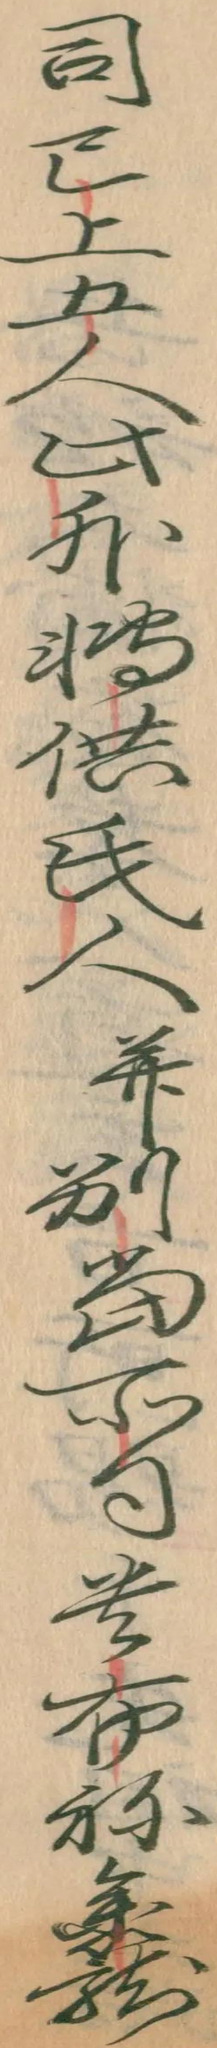司已-上五-人此_外転-供氏并別-当所-司貴-布-祢参-籠
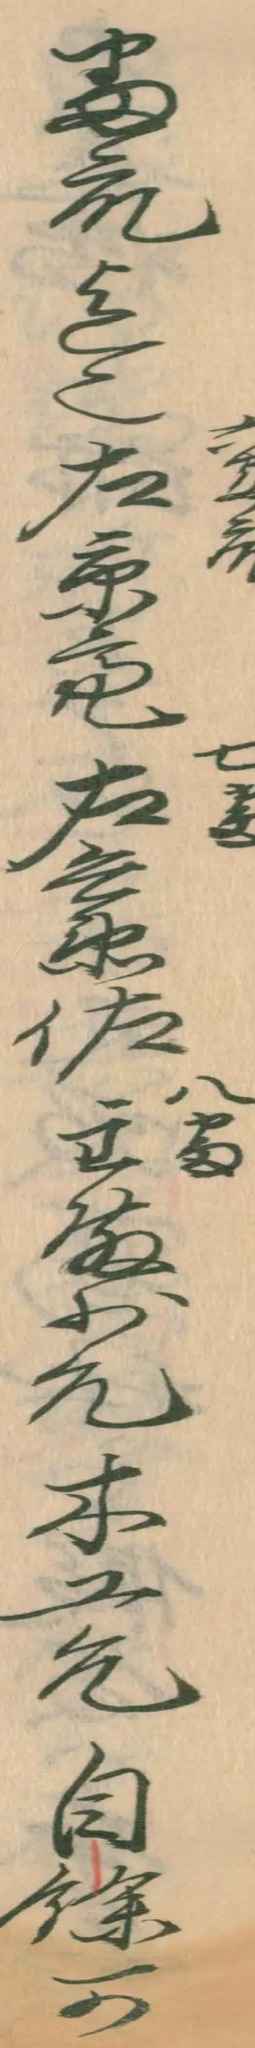番衆迄也左京亮右兵衛佐主殿少允木工允自-余可
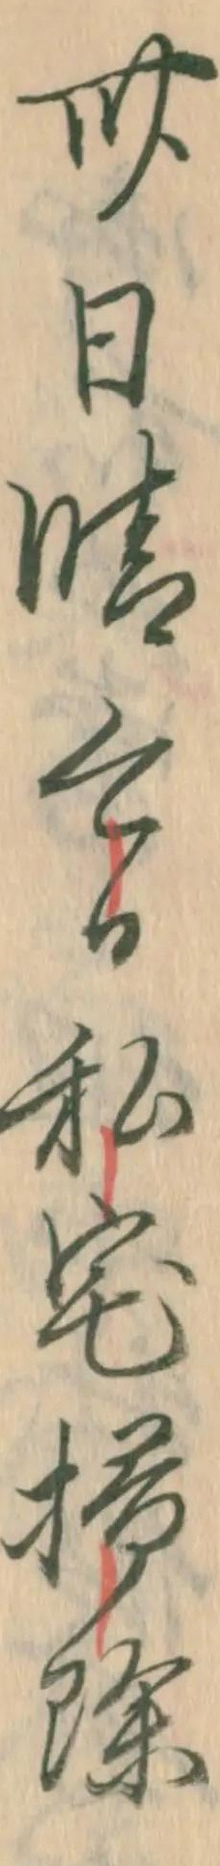卅日晴今-日私-宅掃-除
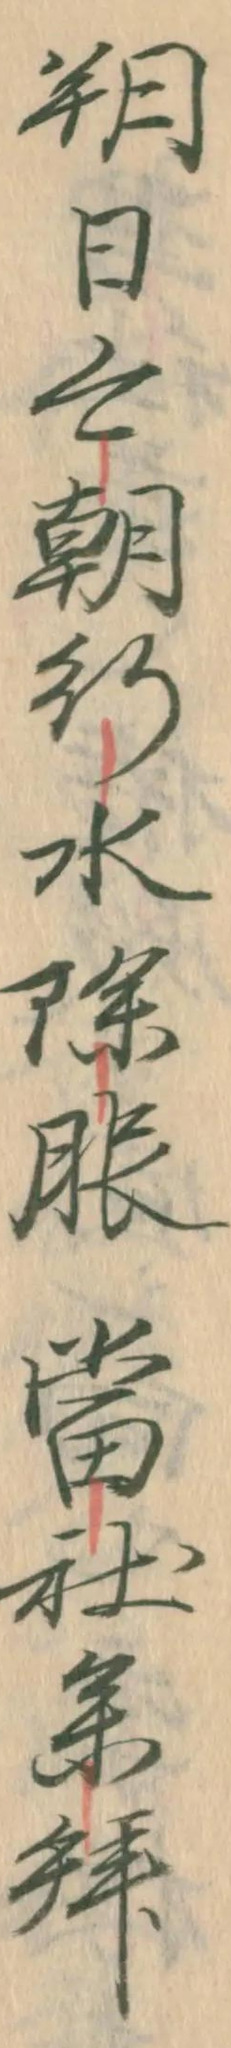朔日今-朝行-水除-服当-社参-拝

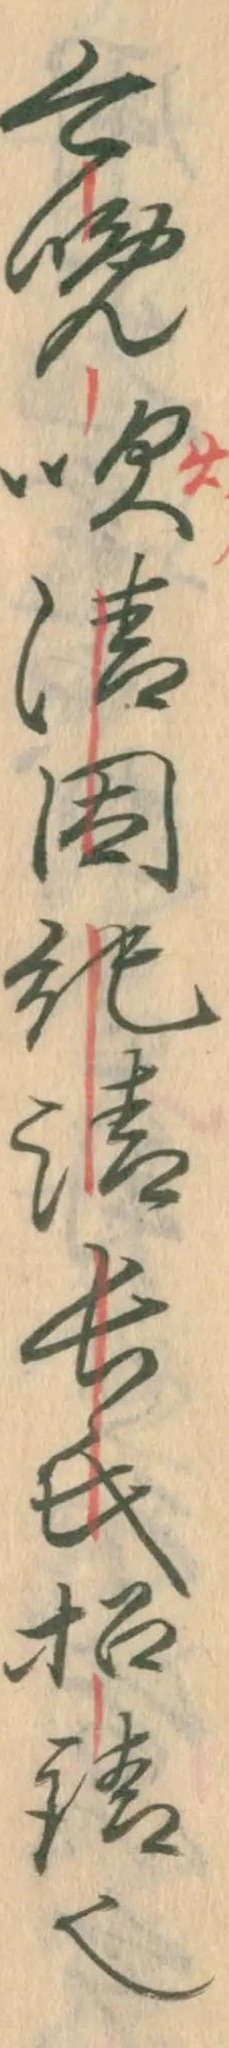今-晩-吹清因紀清長氏招-請也
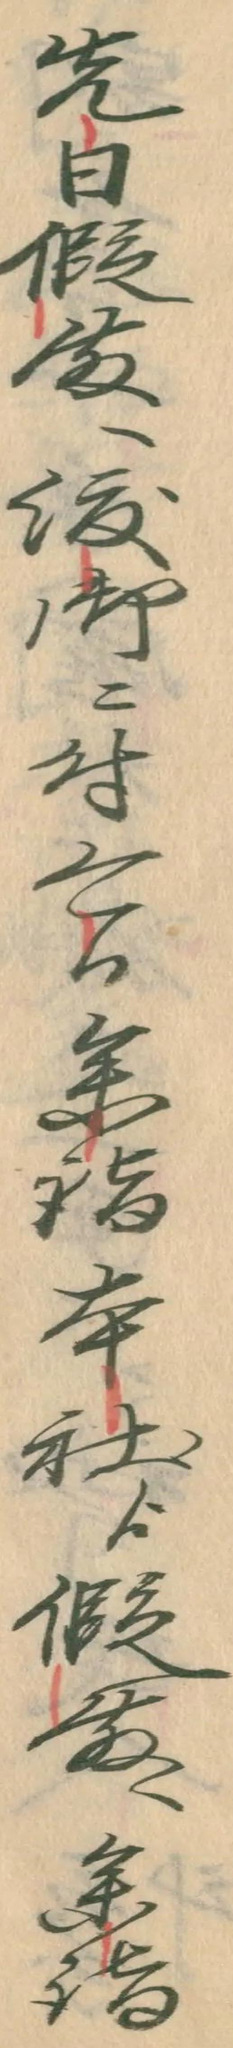先-日仮_殿へ渡-御ニ付今-日参-詣本-社ゟ仮_殿へ参-詣
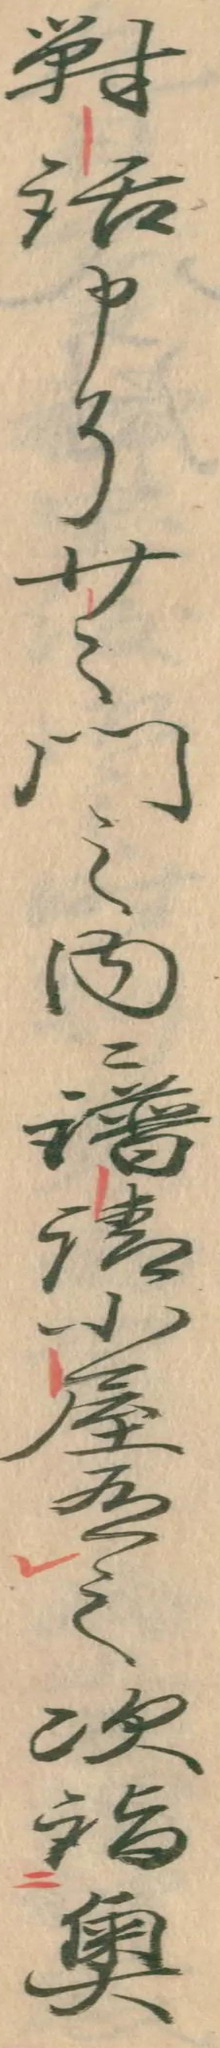対-話申了少-々門之内ニ譜-請小_屋有之次詣奥
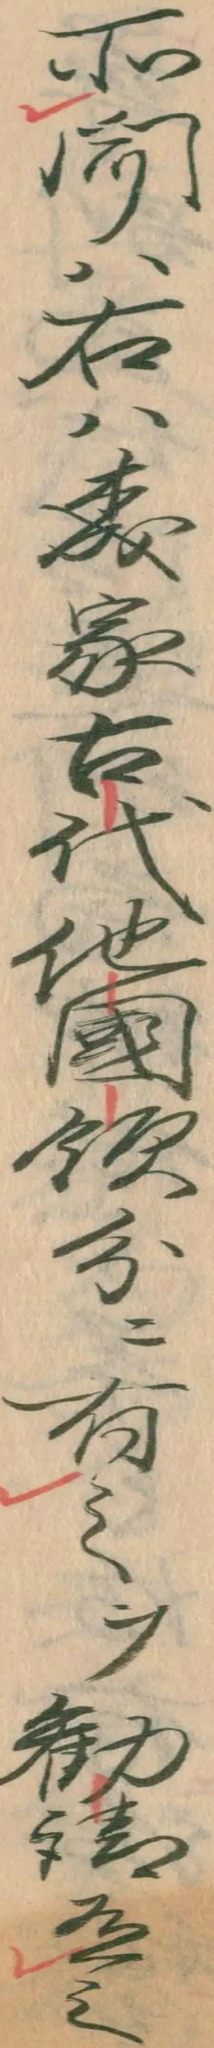所聞ハ右ハ森家古-代他-国-領分ニ有之ヲ勧-請有之
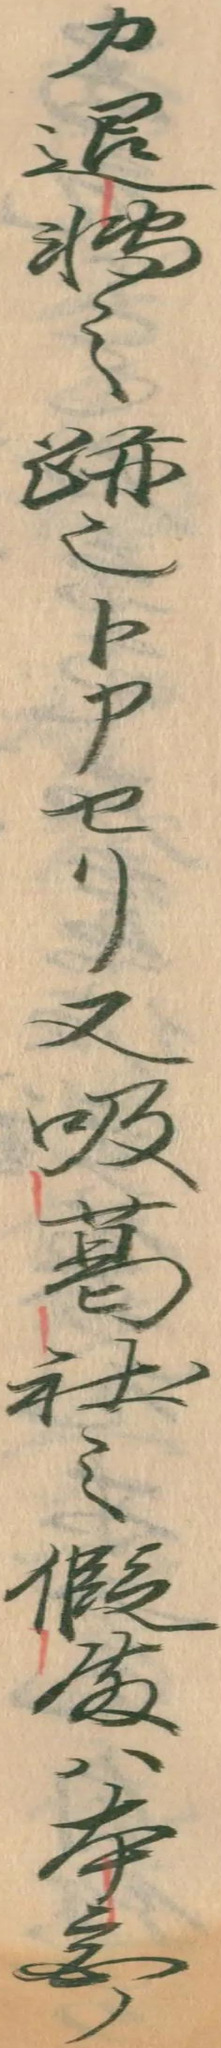カ退-転之跡也ト申セリ又吸_葛_社之仮_殿ハ本-宮ノ
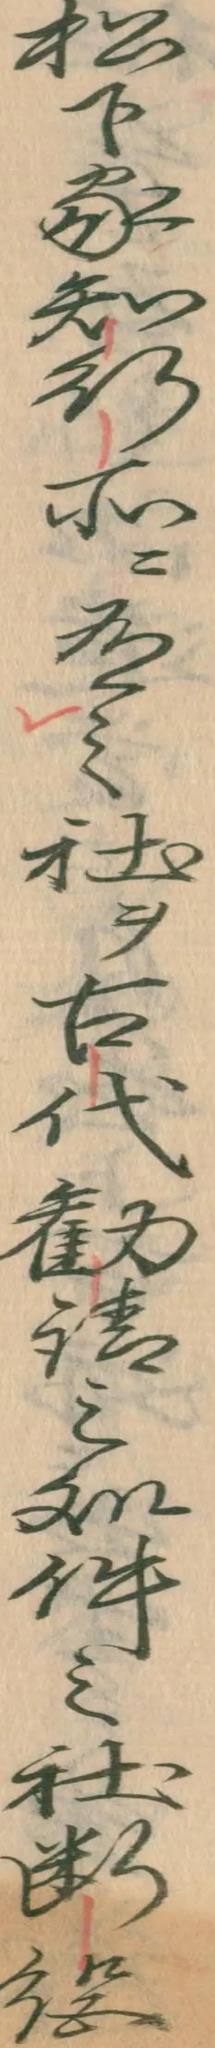松下家知-行-所ニ有之社ヲ古-代勧-請之処件之社断-絶
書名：賀茂社記録. 第16冊
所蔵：国立国会図書館 National Diet Library, JAPAN
